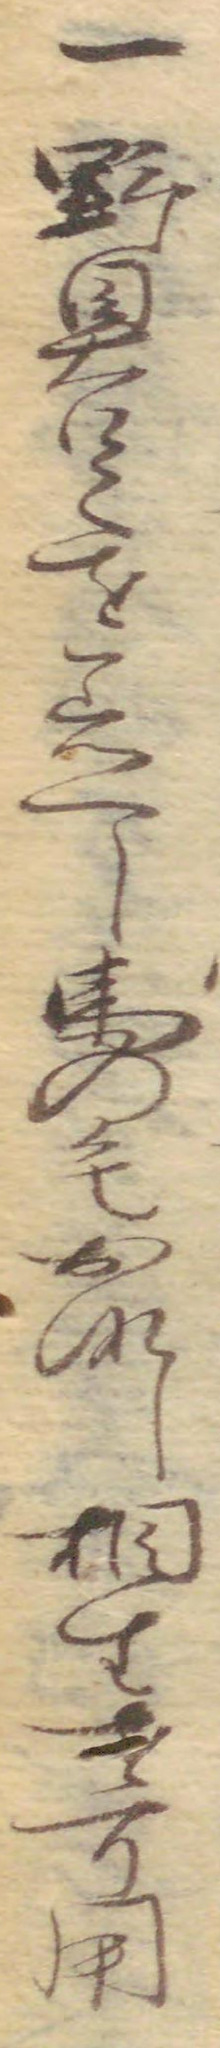一野具足を着へし馬の毛おなし相生を可用

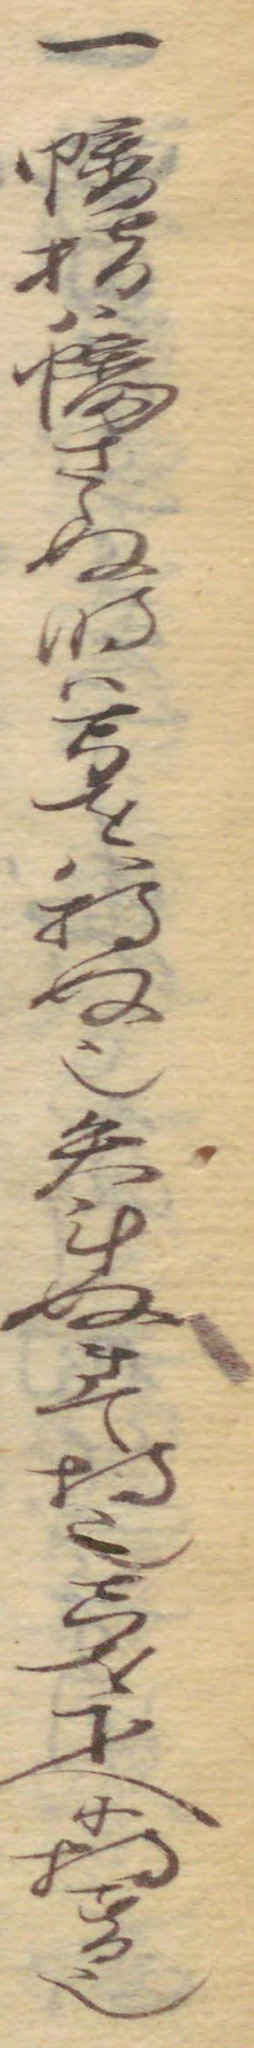一幡指ハ幡さゝぬ時ハ弓をハ持ぬ也矢斗ぬきて持也弓を下人に持する也
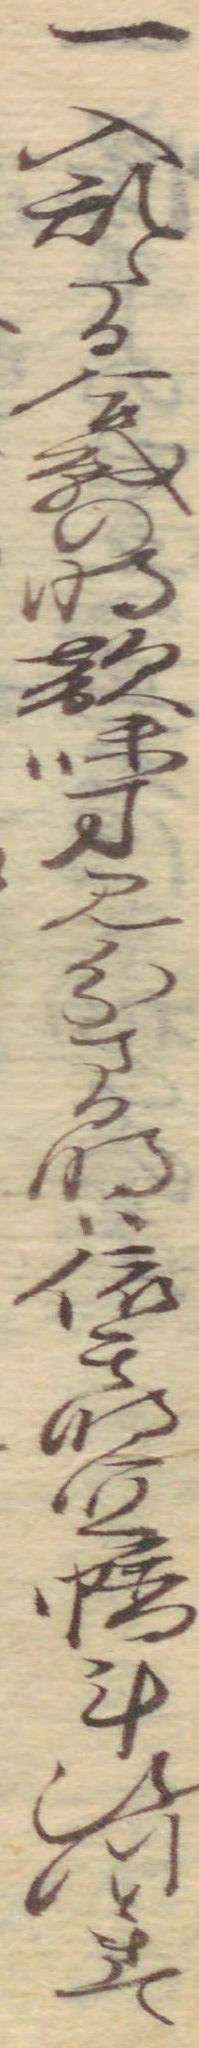一入乱たる合戦の時敵味方見分さる時ハ依其時宜幡斗ひつときて
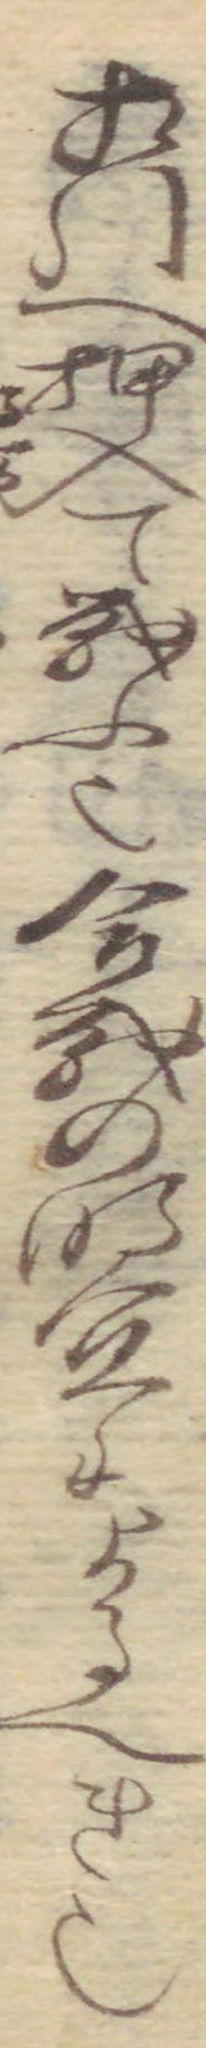相引へ押入て戦ふ也合戦の時宜によるへき也
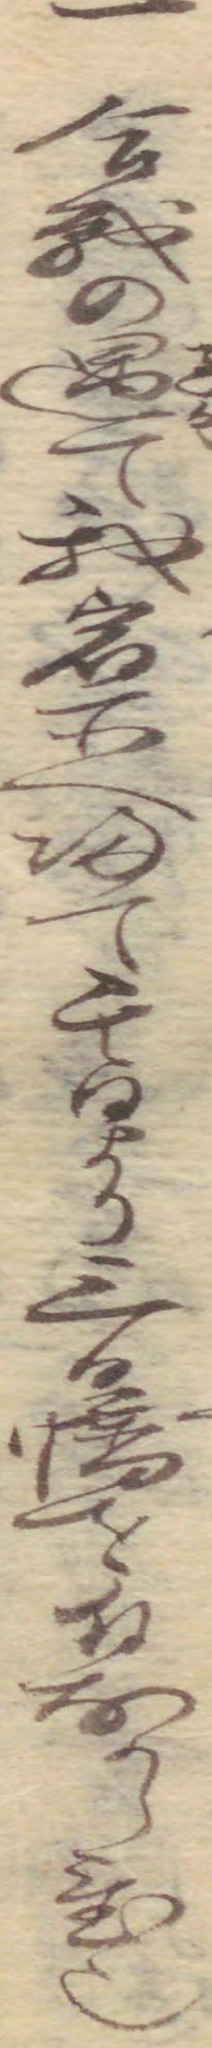一合戦の遇て我宿所へ帰て其日より三日幡を付なから置也
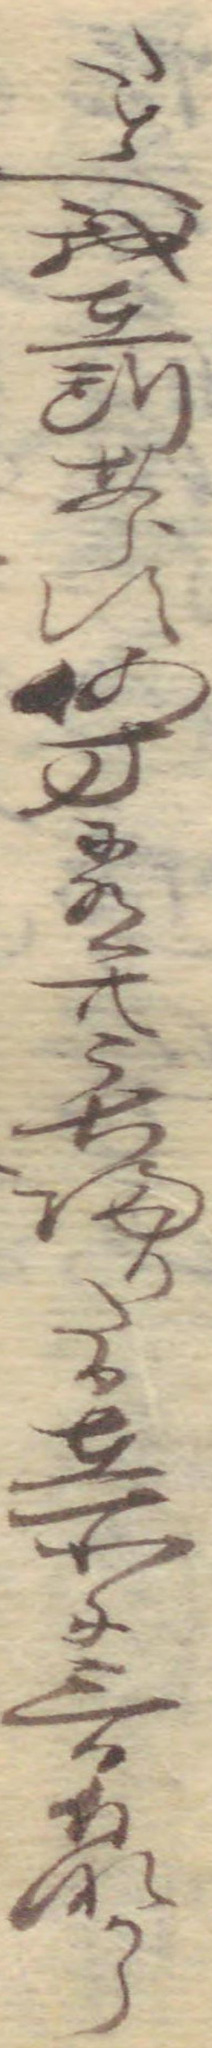たとへ我在所ならす何方に有共うち帰りたる在所に三日付なから
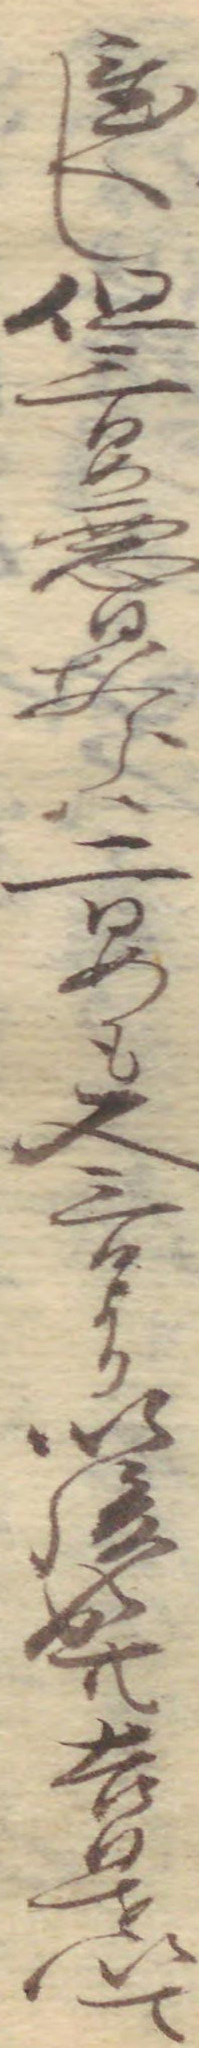置へし但三日め悪日ならは二日めも又三日より以後成共吉日を以て
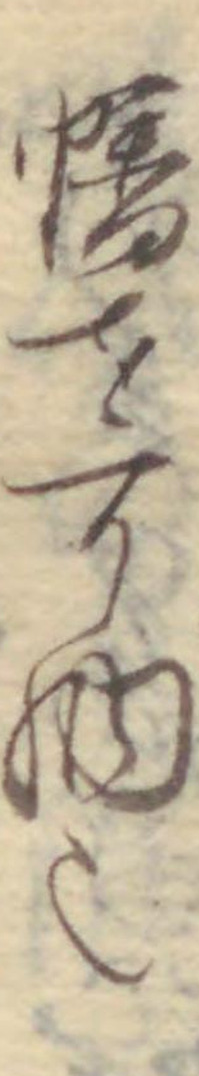幡を可納也
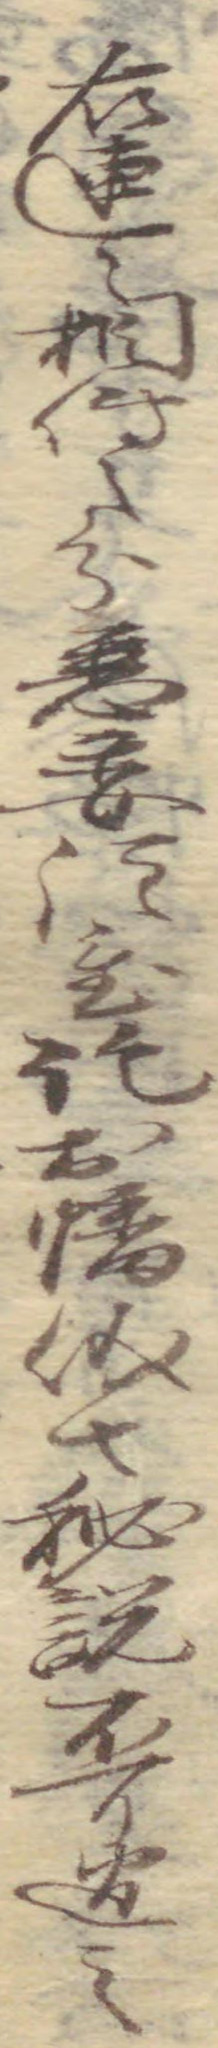右連々相伝之分悉委注置訖於幡儀者秘説不可過之
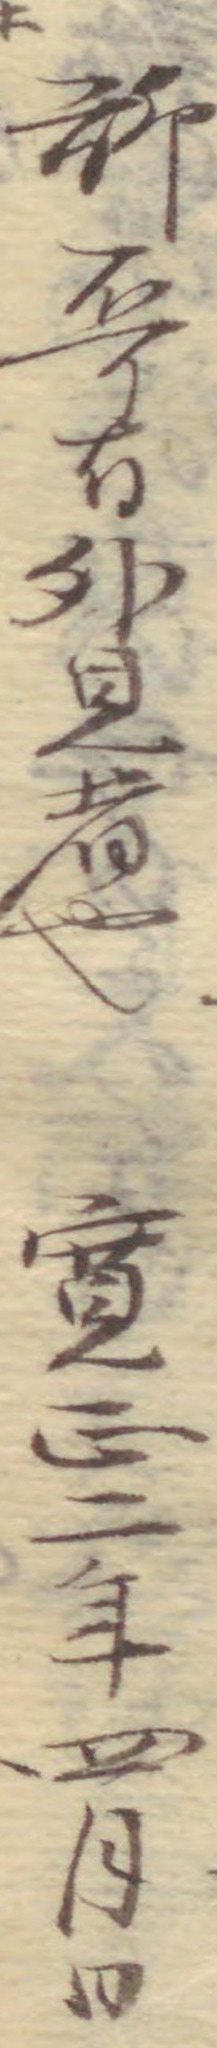聊不可有外見者也寛正二年四月日
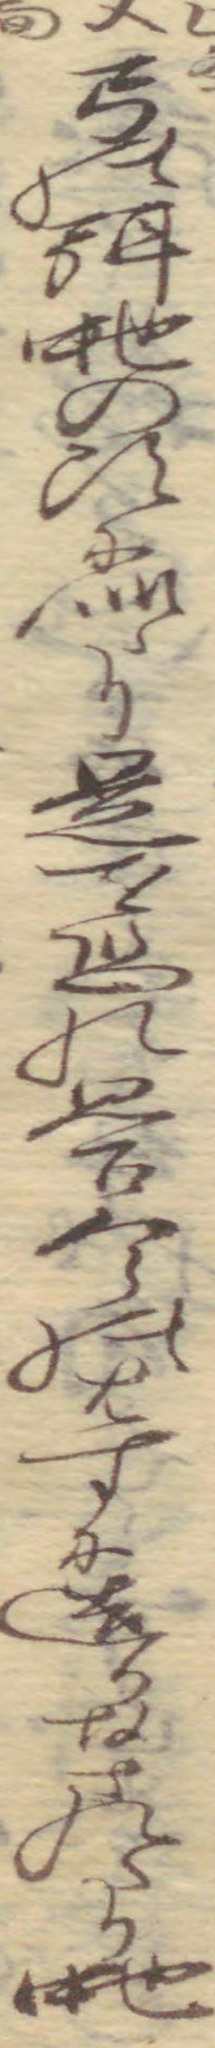一又弓の弭虵の頭に似たり是を恐れ思召今のはすに造りなされたり虵
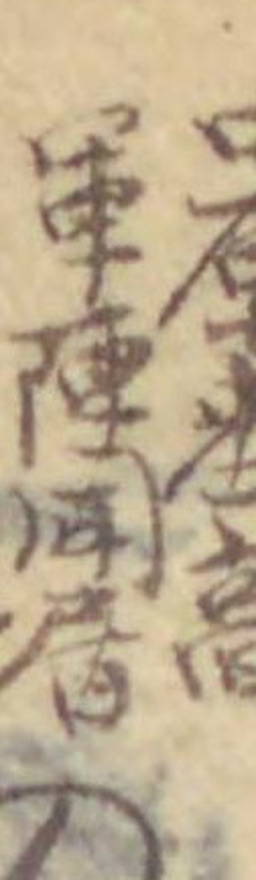軍陣聞書
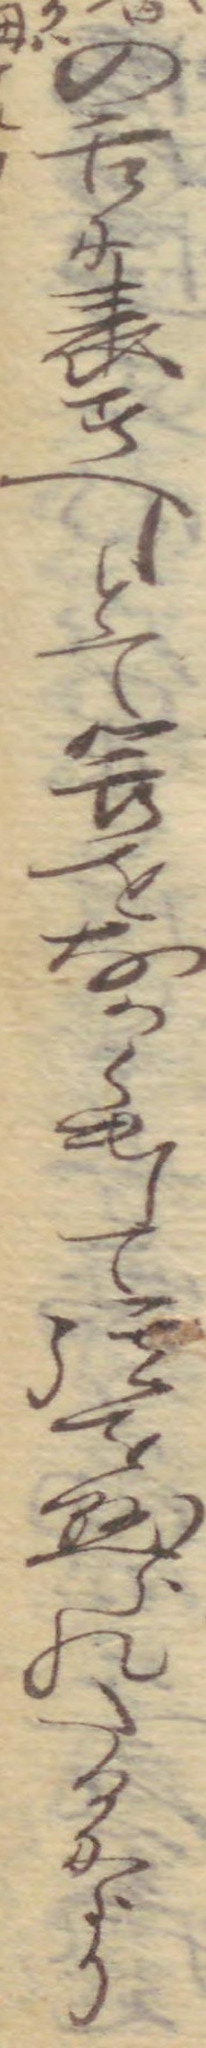の舌に表すへしとて筈をなかく出して弦を懸けられたるにより
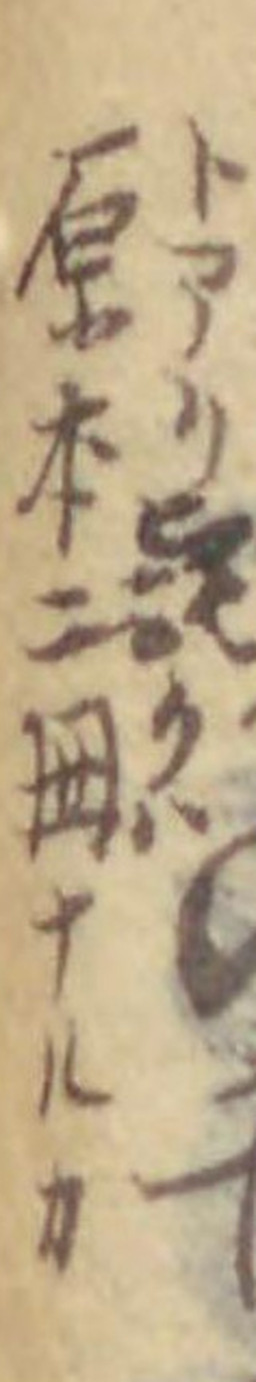原本二冊ナルカ
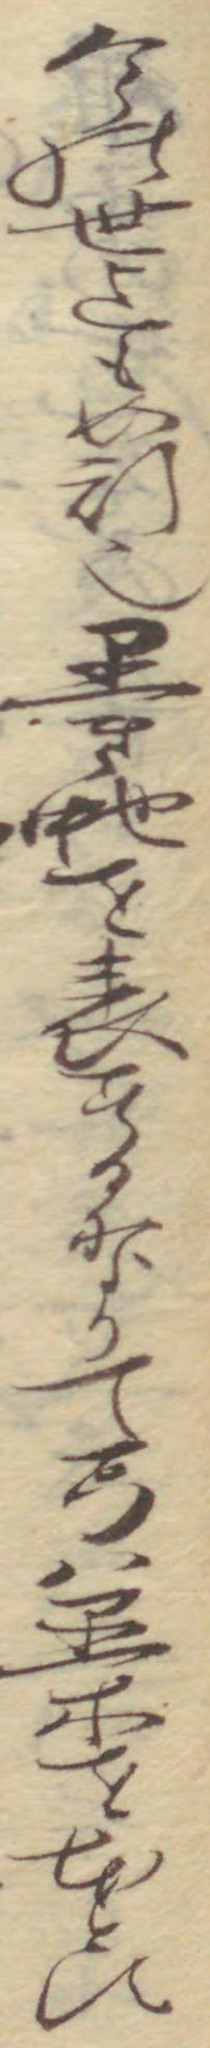今の世迄も如斯也黒き虵を表するによりて弓ハ黒木を本とす
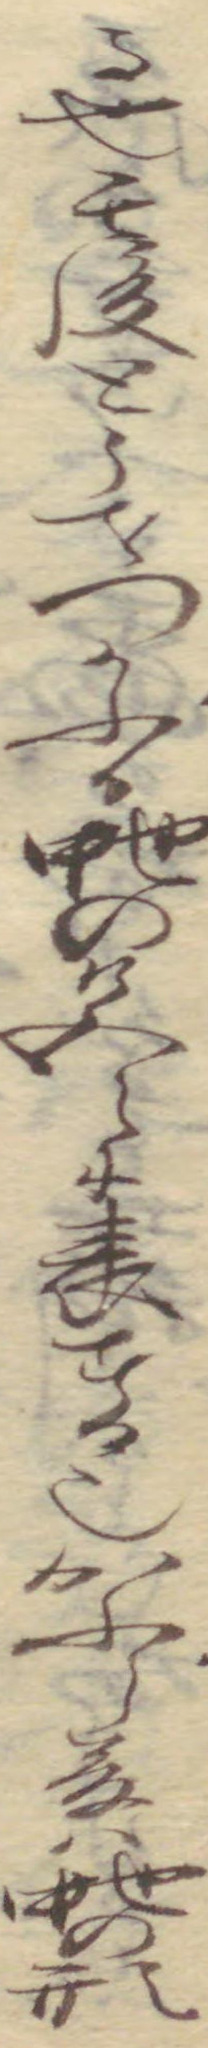る也其後とうをつかふる虵の色々に表する也かふら藤ハ虵の形
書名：鶯宿雑記. 巻199-200
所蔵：国立国会図書館 National Diet Library, JAPAN
